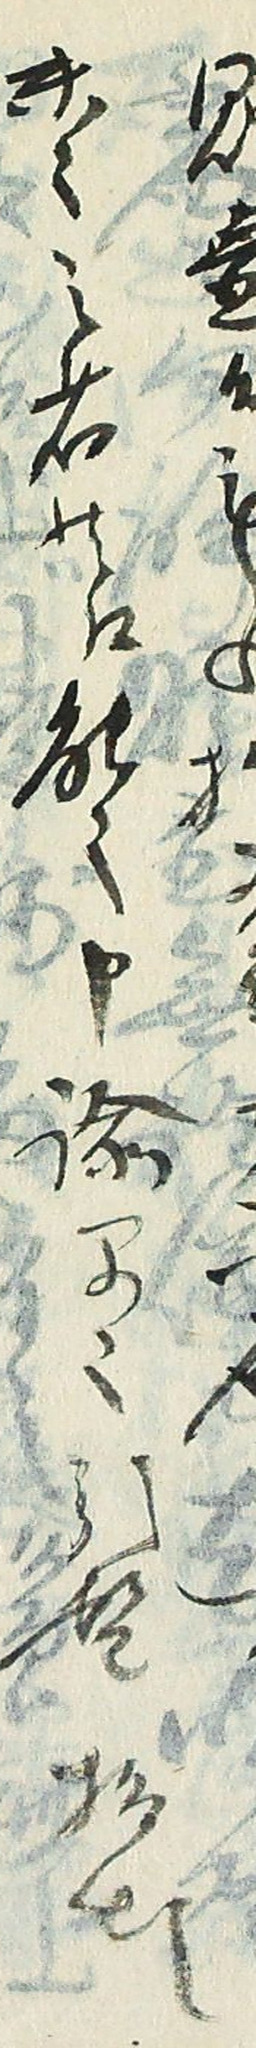末々之者共江能々申諭早々引替指出し
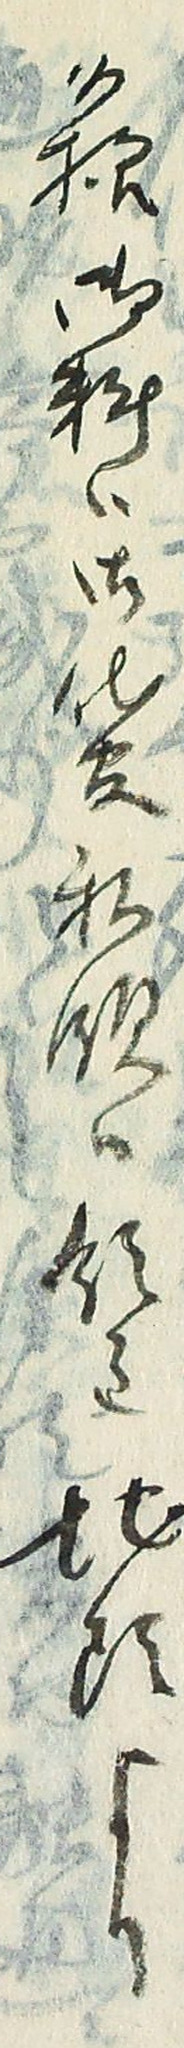候様御料は御代官私領は領主地頭より
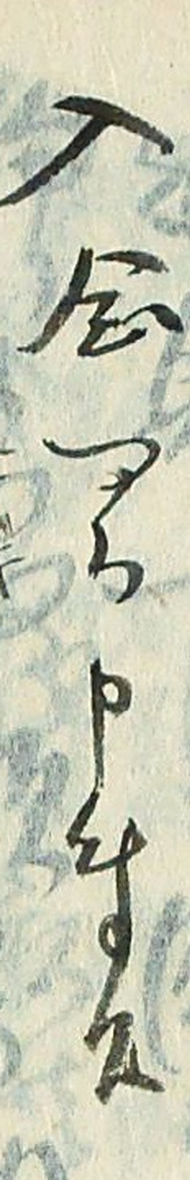入念可被申付候
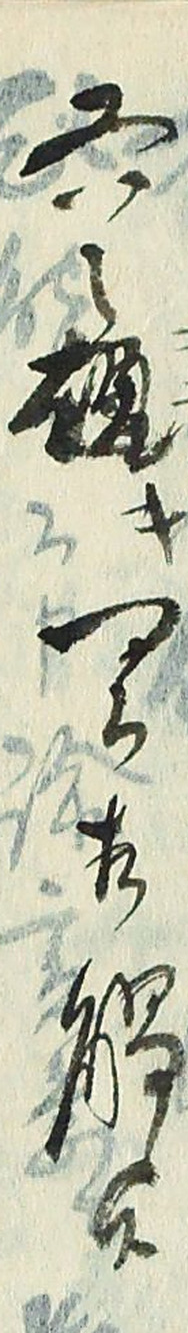右之趣き可相触候
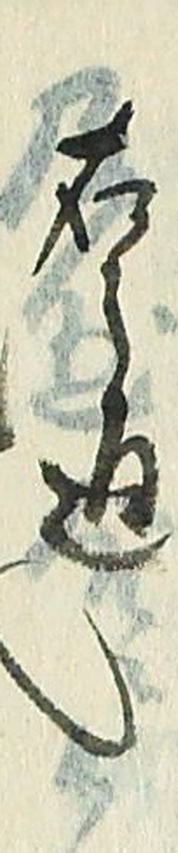右之通
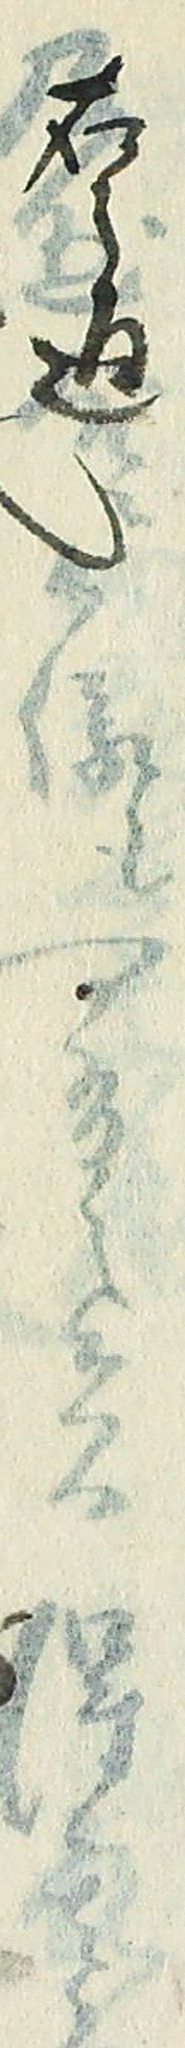右之通
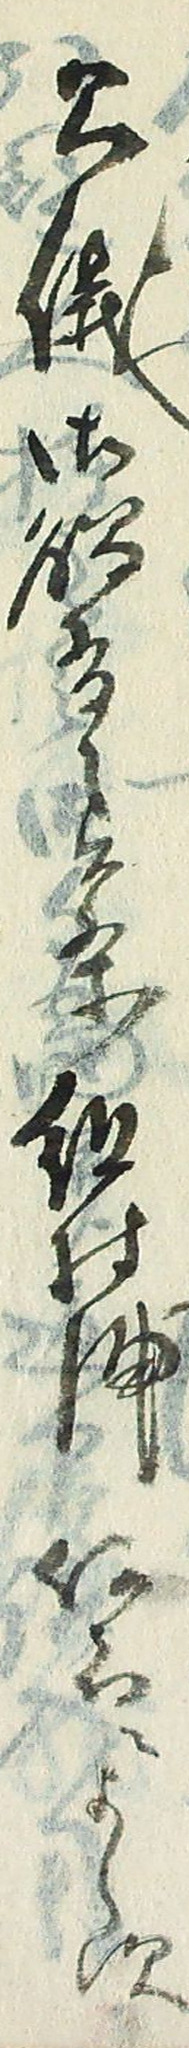公儀御触有之候条組村浦何者によらす
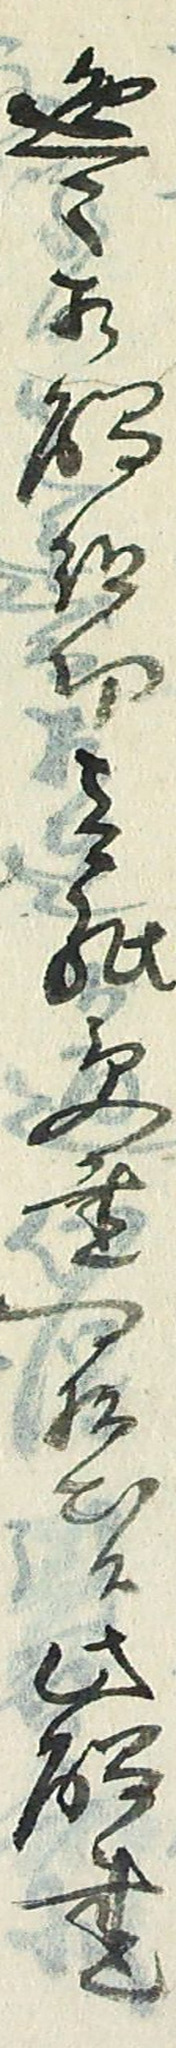逸々相触組切壱紙受書可指出候此触書
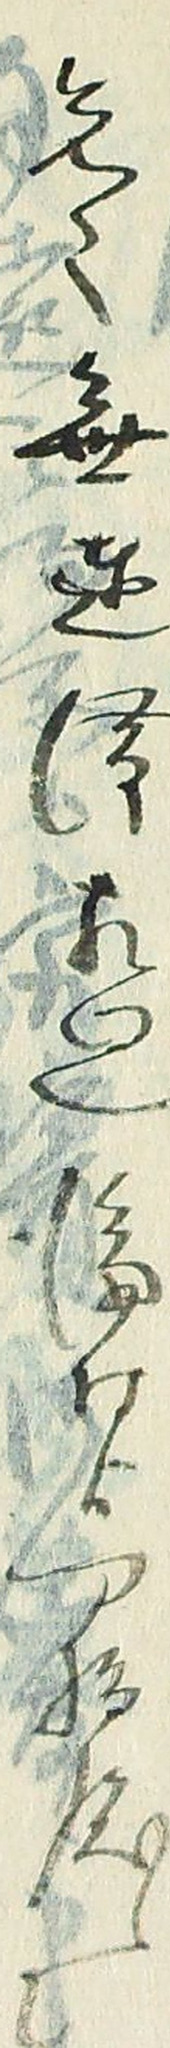先々無遅滞相廻済村ゟ可指戻候以上
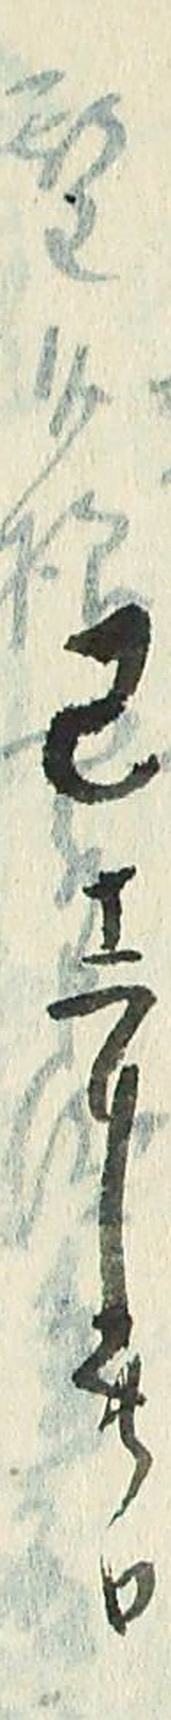巳十二月廿日
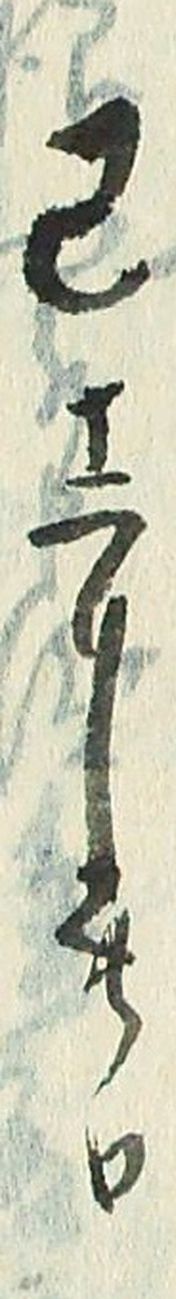巳十二月廿日
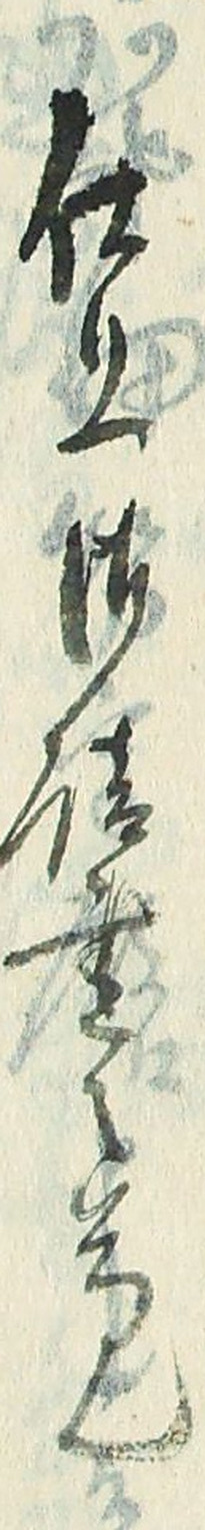仕上御請書之覚
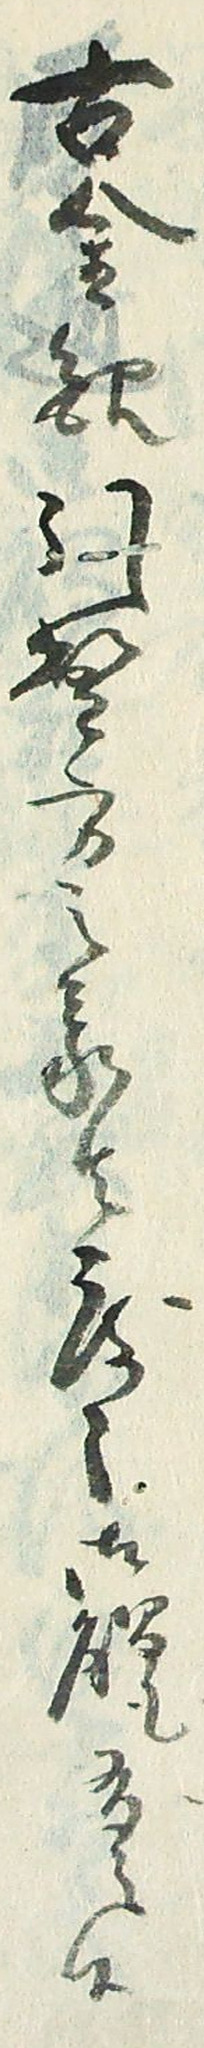古金銀引替方之義は度々御触有之候

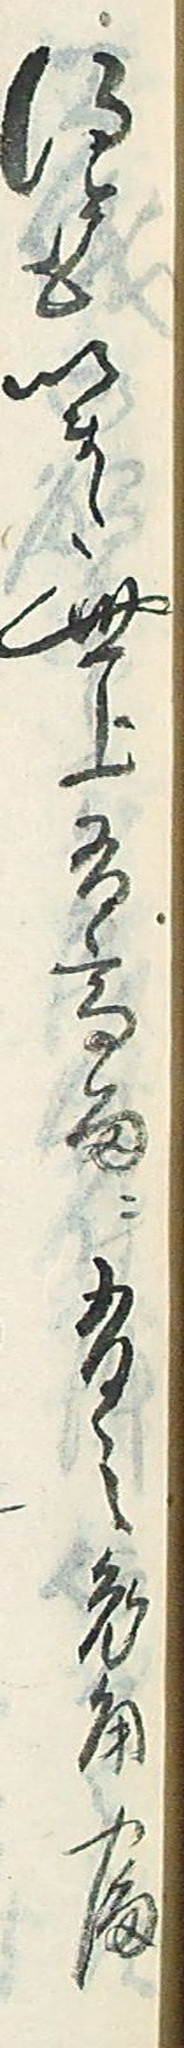得ともいまた世上有高多に有之兎角富
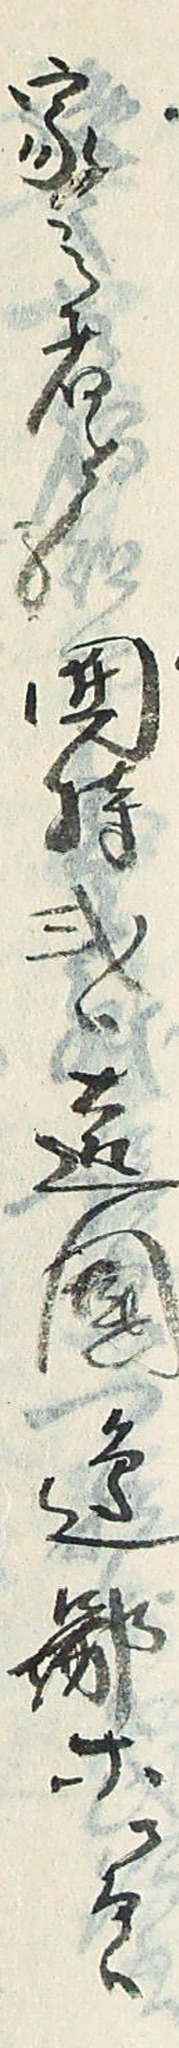家之者とも囲持或は遠国辺鄙等にては
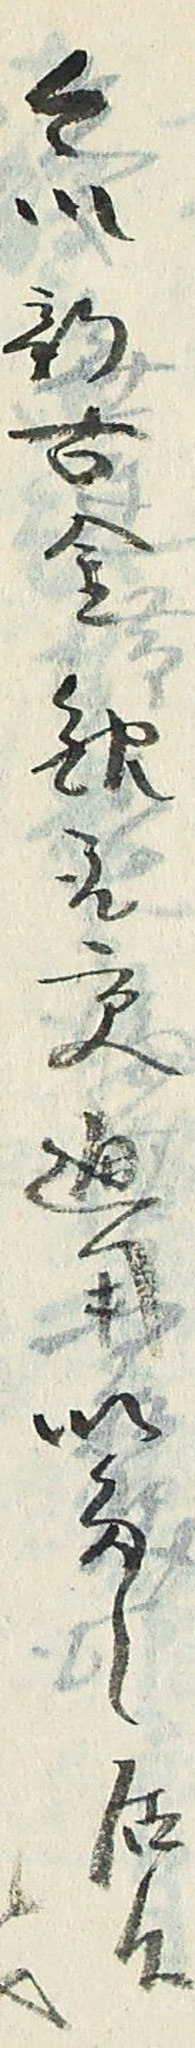今以新古金銀取交通用いたし居候
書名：諸御用御□受書控
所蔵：鳴門教育大学 Naruto University of Education
